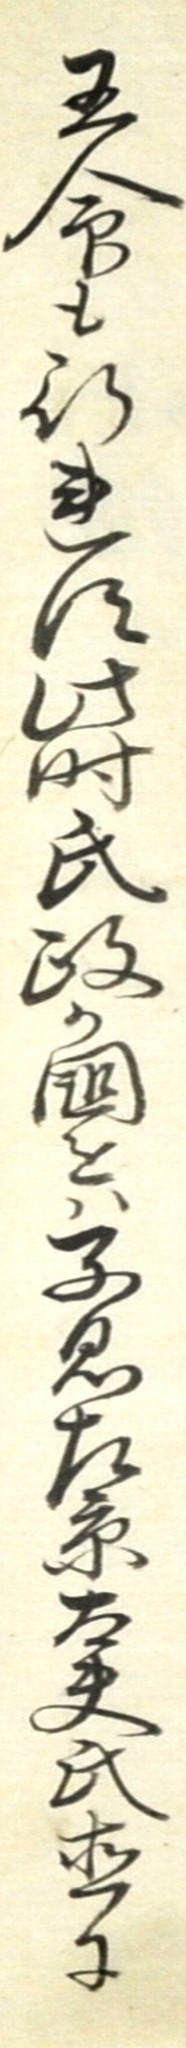王命も行れす此時氏政か国をは子息左京太夫氏直に
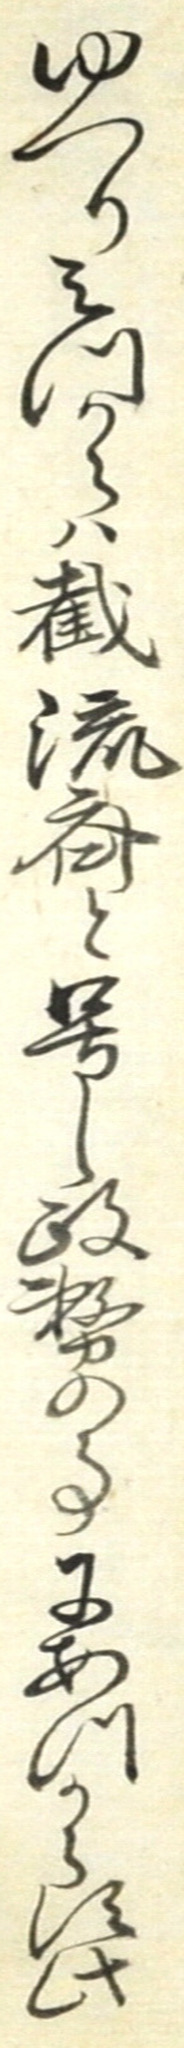ゆつりみつからは截流斎と号し政務の事にあつからす此
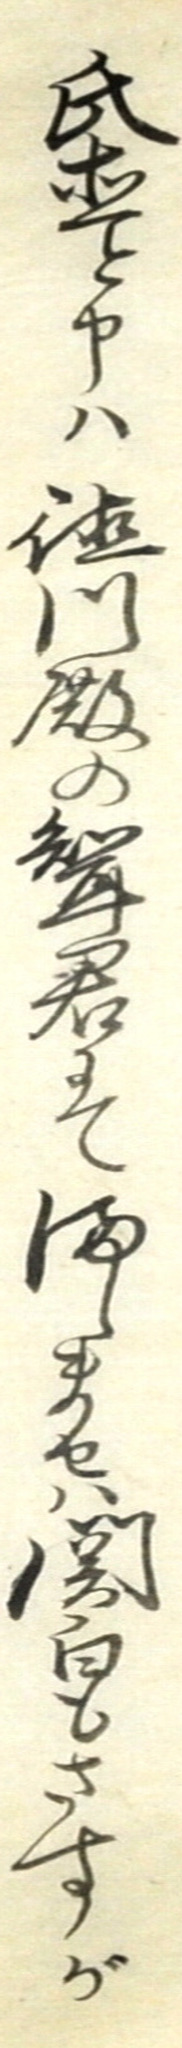氏直と申は徳川殿の聟君にてましませは関白もさすが
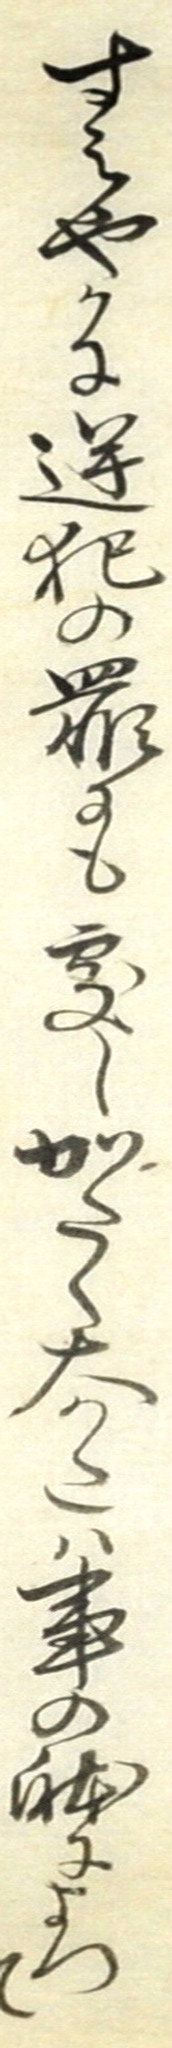すみやかに逆犯の罪にも処しかたく大かたは事の体によつて
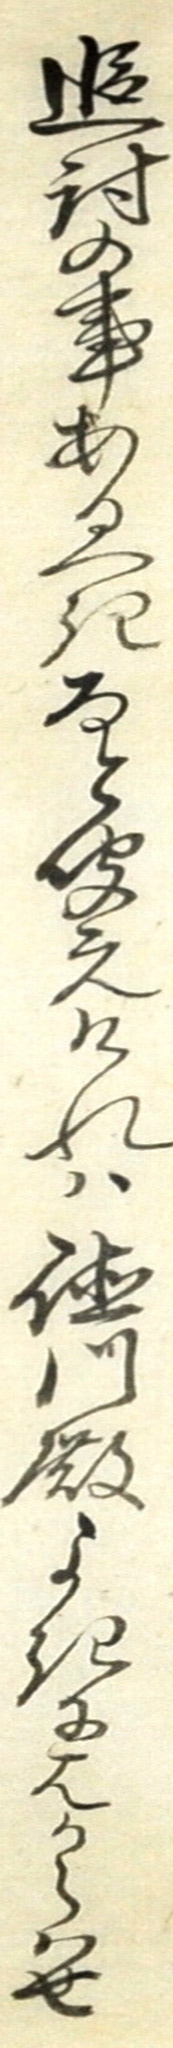追討の事あるへきなと聞えけれは徳川殿よきにはからはせ
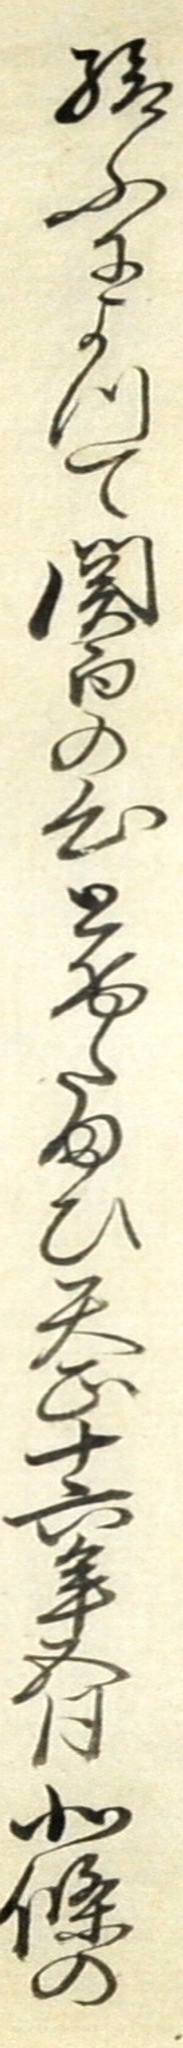給ふによよつて関白の心とけたまひ天正十六年五月北条の
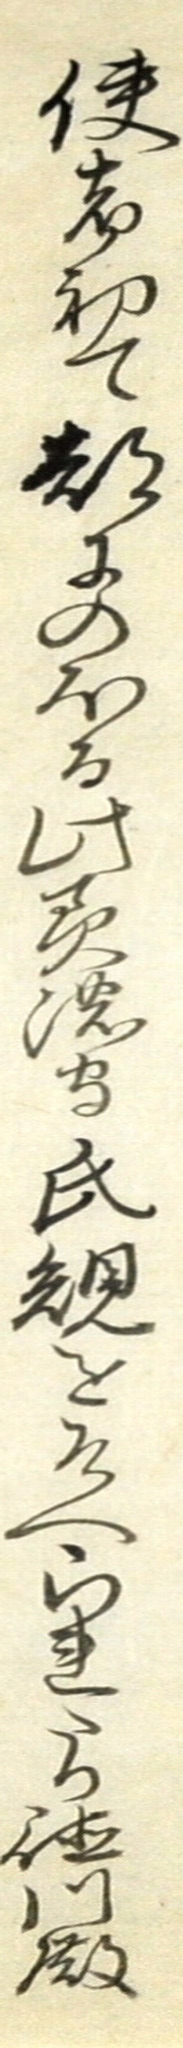使者初て都にのほる此美濃守氏親をそへられたり徳川殿
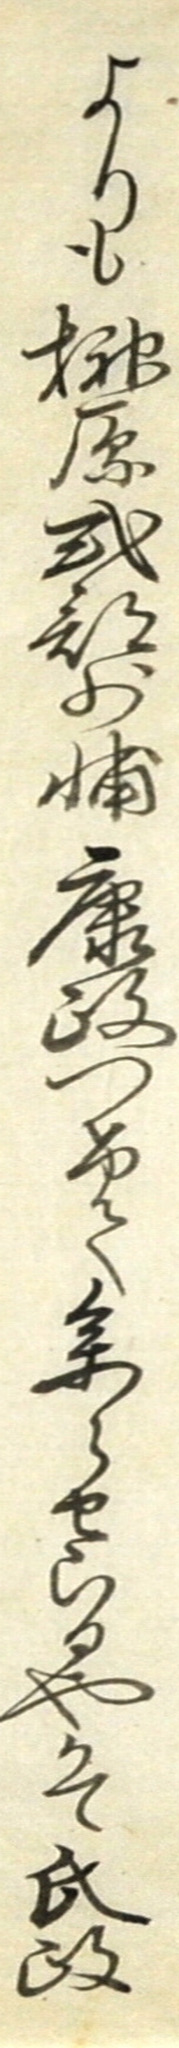よりも榊原式部少輔康政つけて参らせるやかて氏政
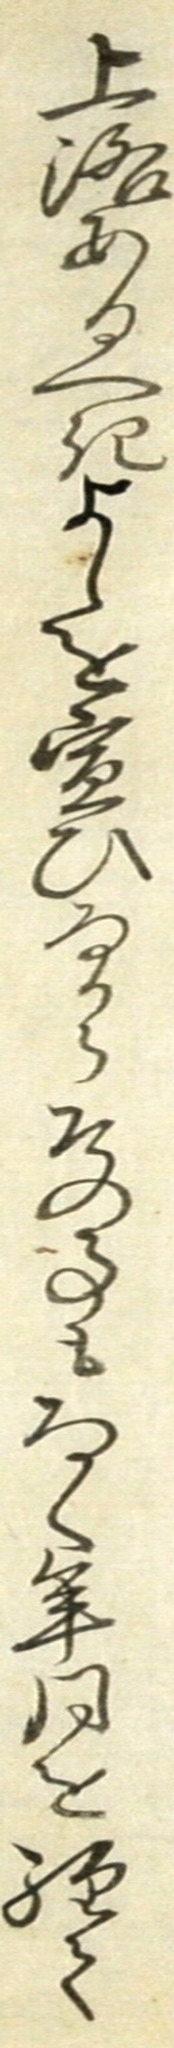上洛あるへきよしを宣ひなからその事もなく年月を経て
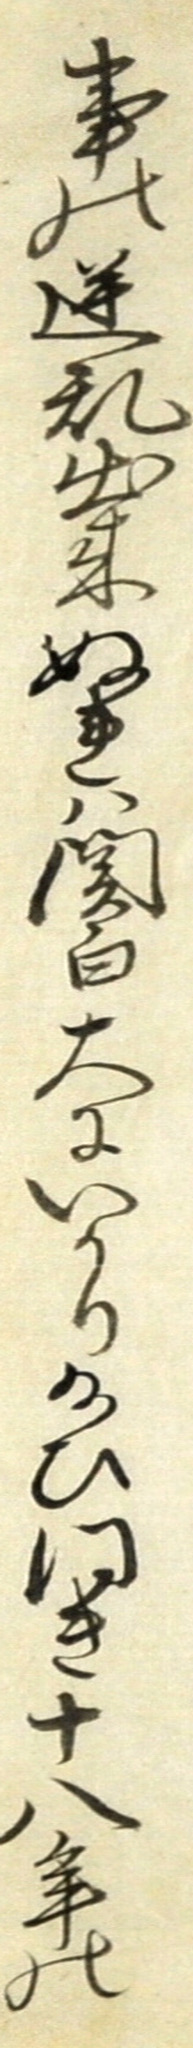事の逆乱出来ぬれは関白大にいかり給ひ同き十八年の
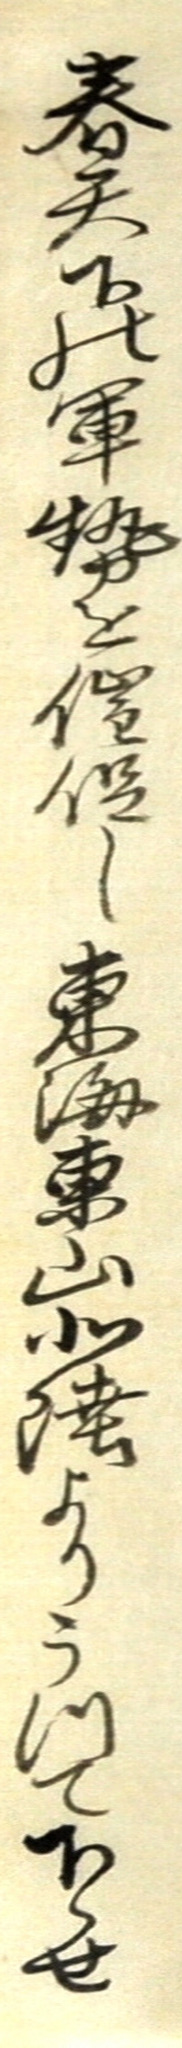春天下の軍勢を催促し東海東山北陸よりうつて下らせ

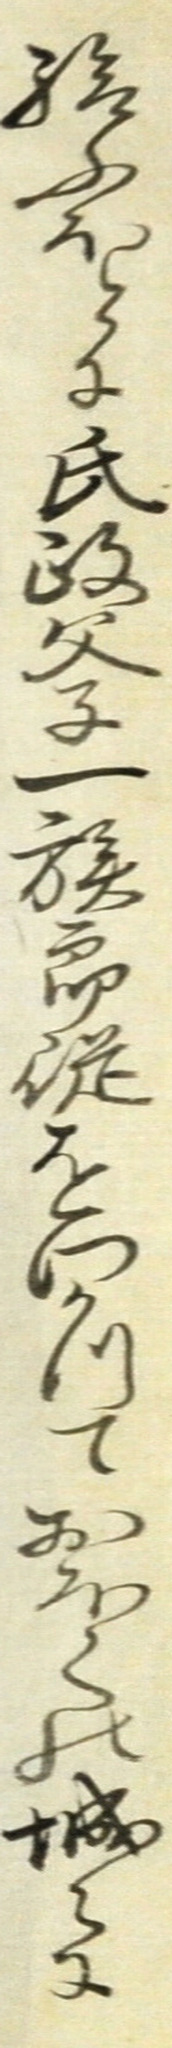給ふほとに氏政父子一族郎従をわかつておほくの城々に
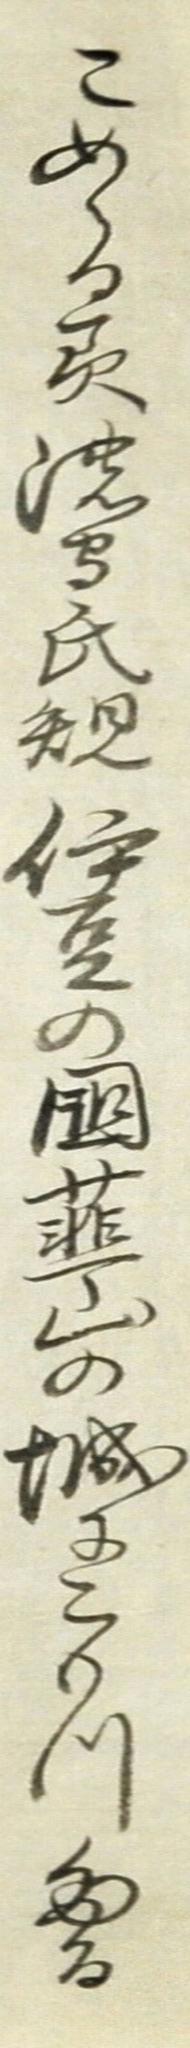こめらる美濃守氏規伊豆の国韮山の城にここもつたる
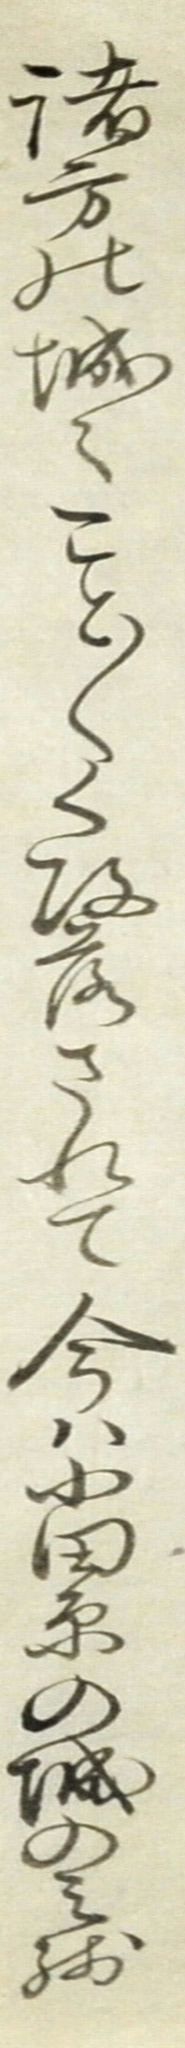諸方の城々こと〳〵く攻落されて今は小田原の城のみ残
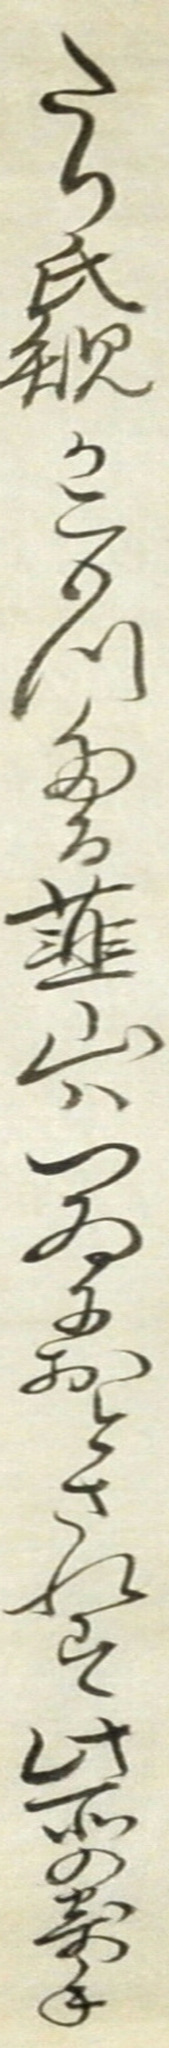たり氏規かこもつたる韮山はつゐにおとされす此所の寄手
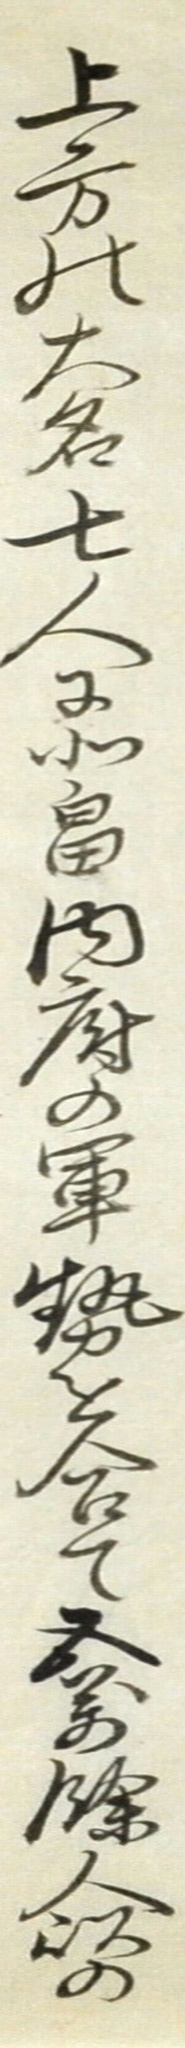上方の大名七人に北畠内府の軍勢を合て五万余人以の
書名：藩翰譜（六）
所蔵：伊那市立高遠町図書館・合同会社AMANE
